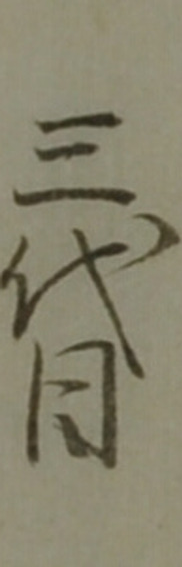三代目
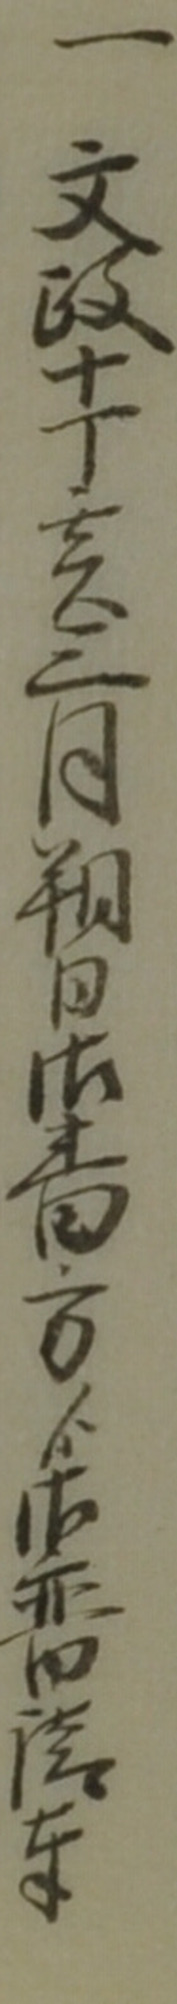一文政十丁亥三月朔日御番方ゟ御普請奉
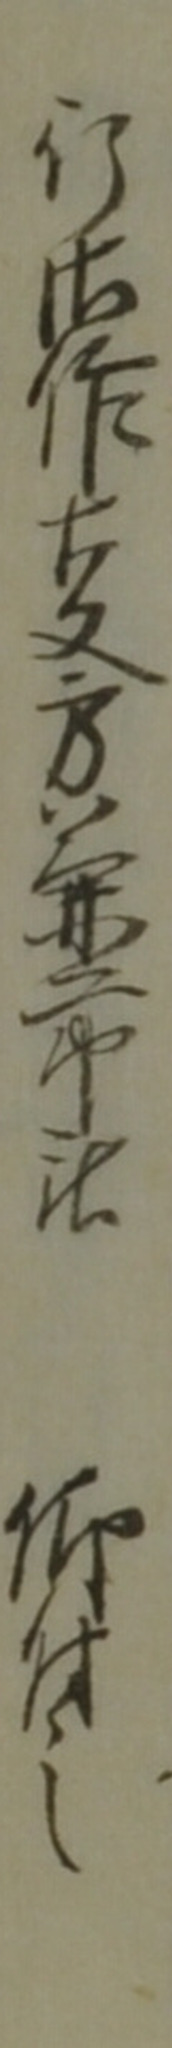行御作事方兼帯被仰付之
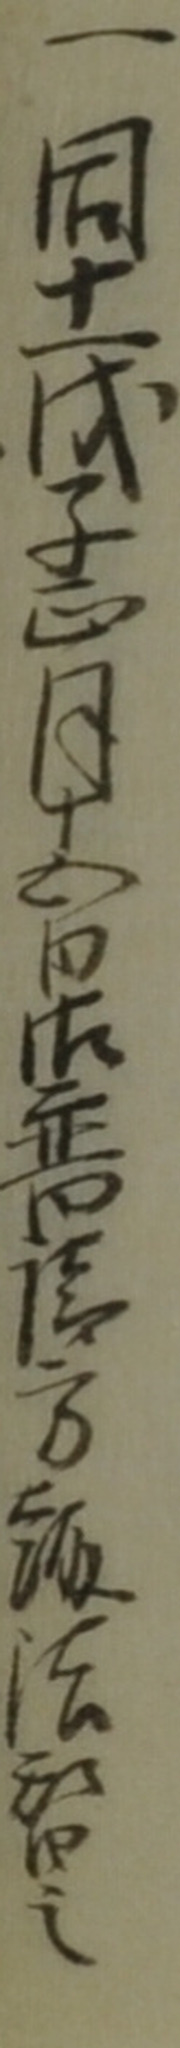一同十一戊子正月十五日御普請方趣法替之
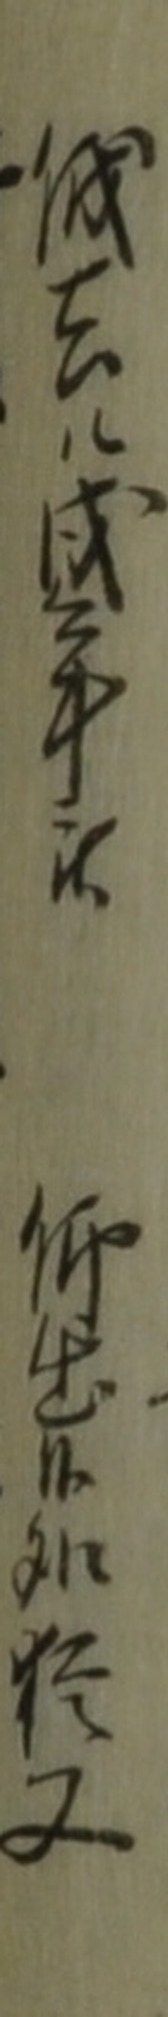儀去ル戌年被仰出候処猶又
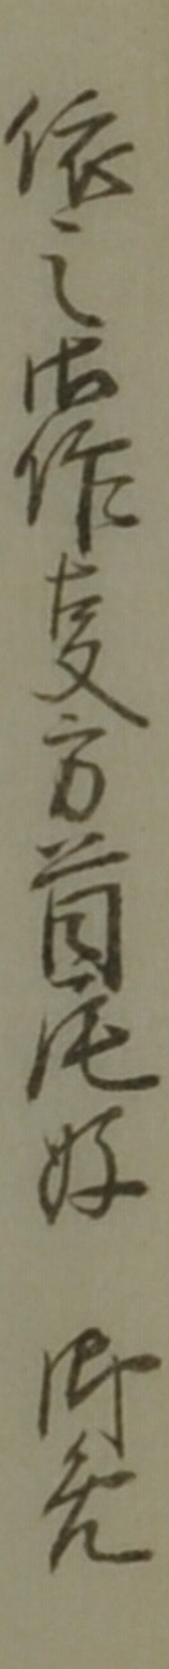依之御作事方首尾好御免
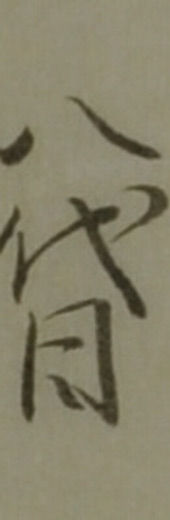八代目
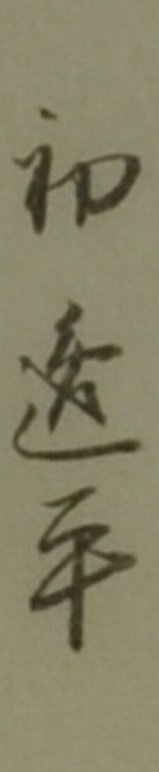初辺平
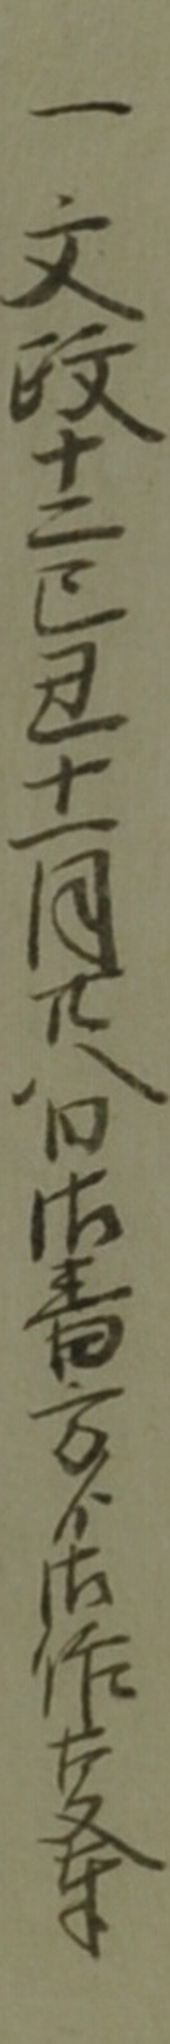一文政十二己丑十一月廿八日御番方ゟ御作事奉
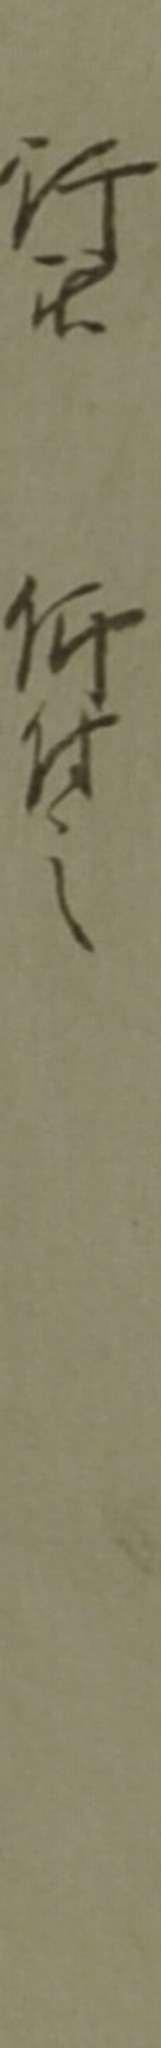行被仰付之
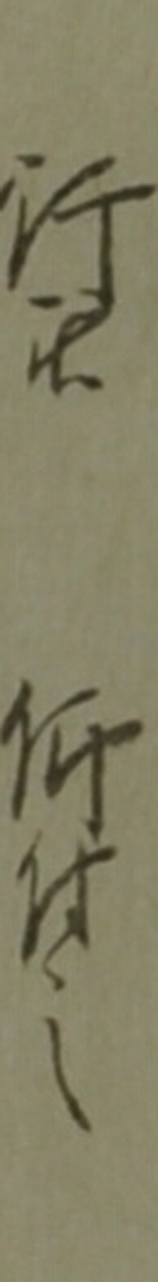行被仰付之
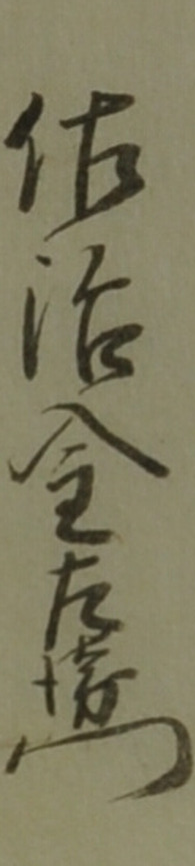佐治金左衛門
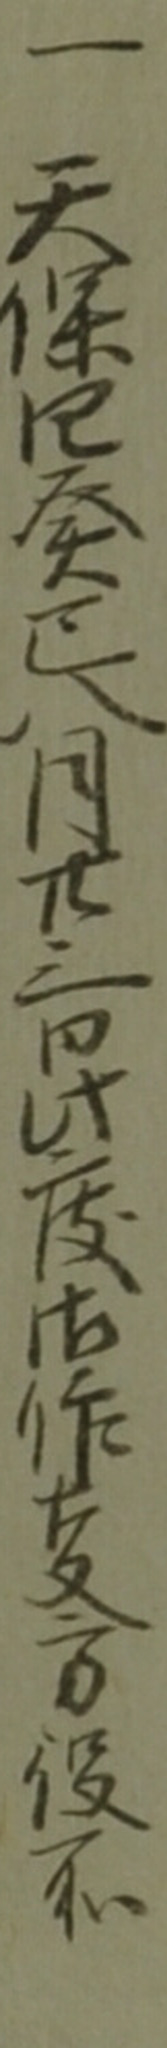一天保四癸巳八月廿三日此度御作事方役所
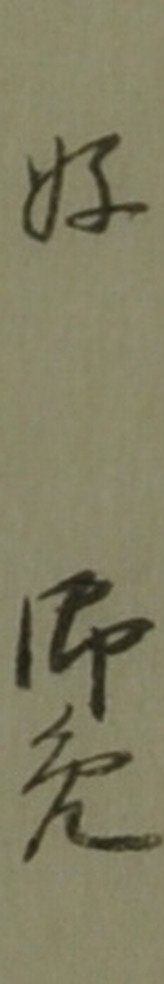好御免
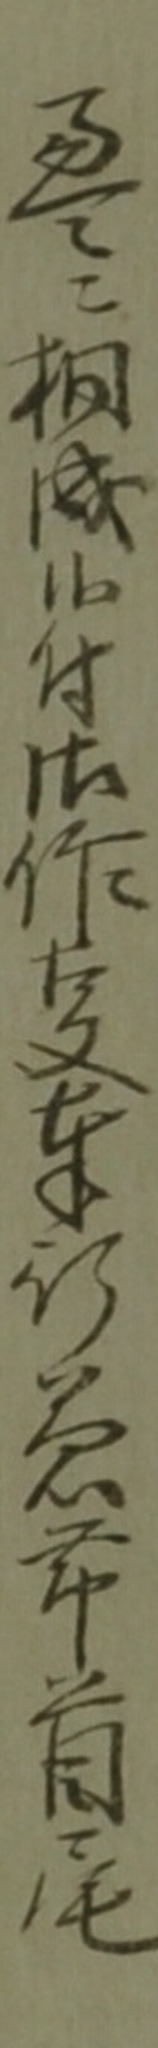◻︎ニ相成候付御作事奉行兼帯首尾
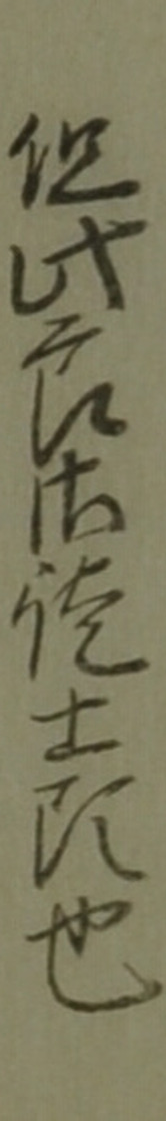但此節御徒士頭也
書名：諸御役代々録（六）
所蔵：伊那市立高遠町図書館・合同会社AMANE
